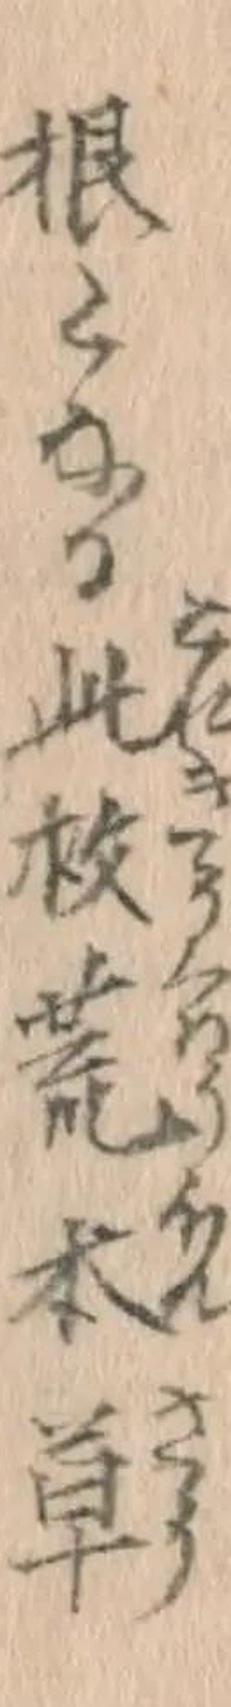根となる此救荒本草
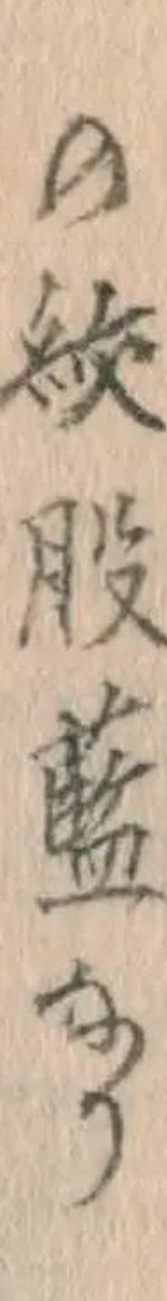の絞股藍なり

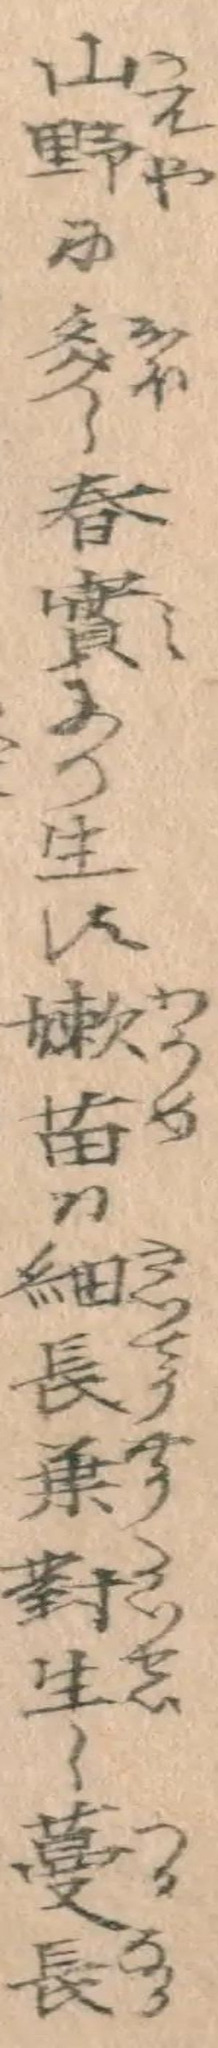山野に多し春実あり生す嫩苗は細長葉対生し蔓長
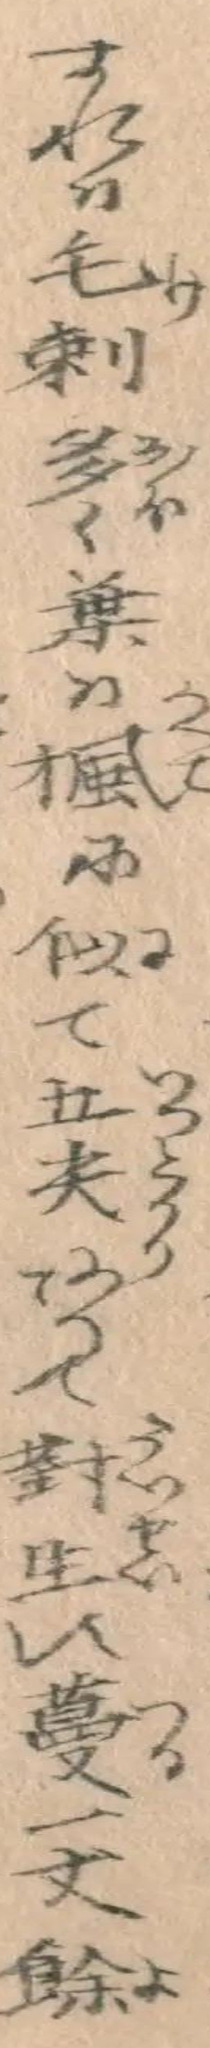すれは毛剌多く葉は楓に似て五尖ありて対生す蔓一丈余
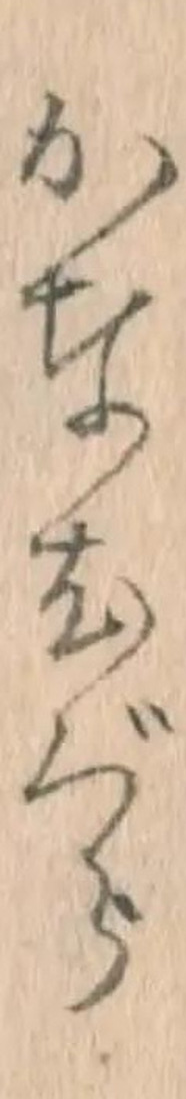かなむぐら

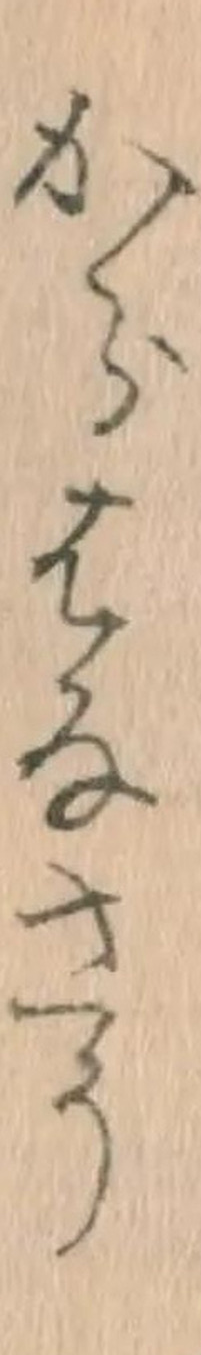からはなさう
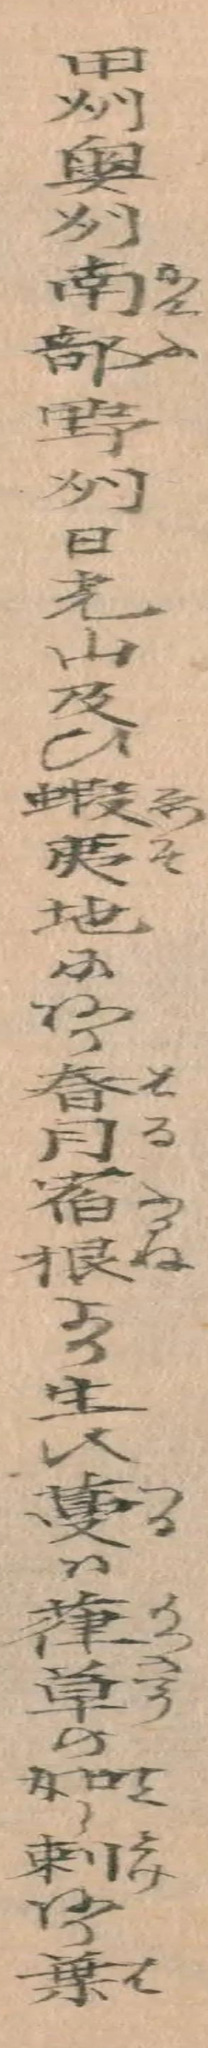甲州奥州南部野州日光山及ひ蝦夷地にあり春月宿根より生す蔓は葎草の如し剌あり葉
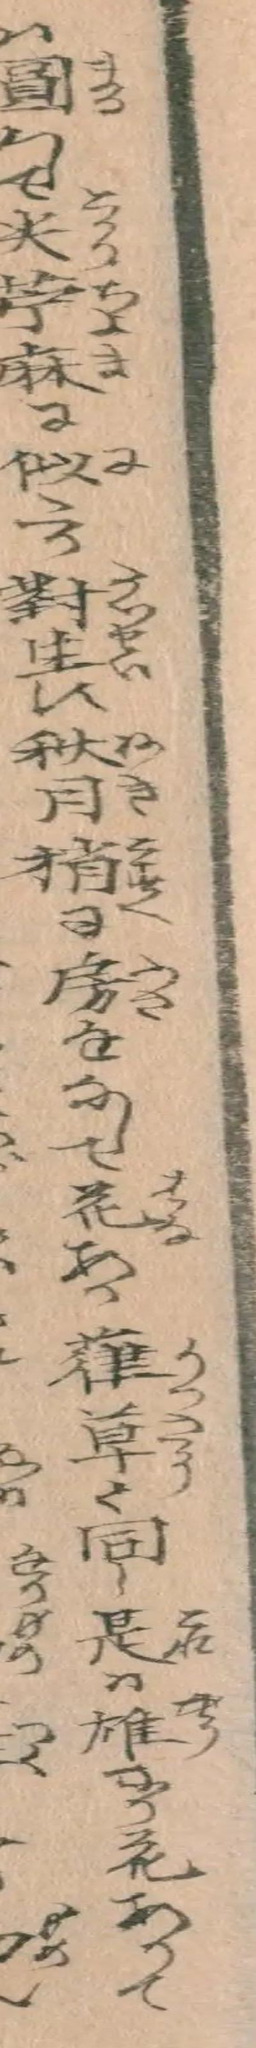は円くして尖苧麻に似たり対生す秋月梢に房をなして花あり葎草と同し是は雄なり花ありて
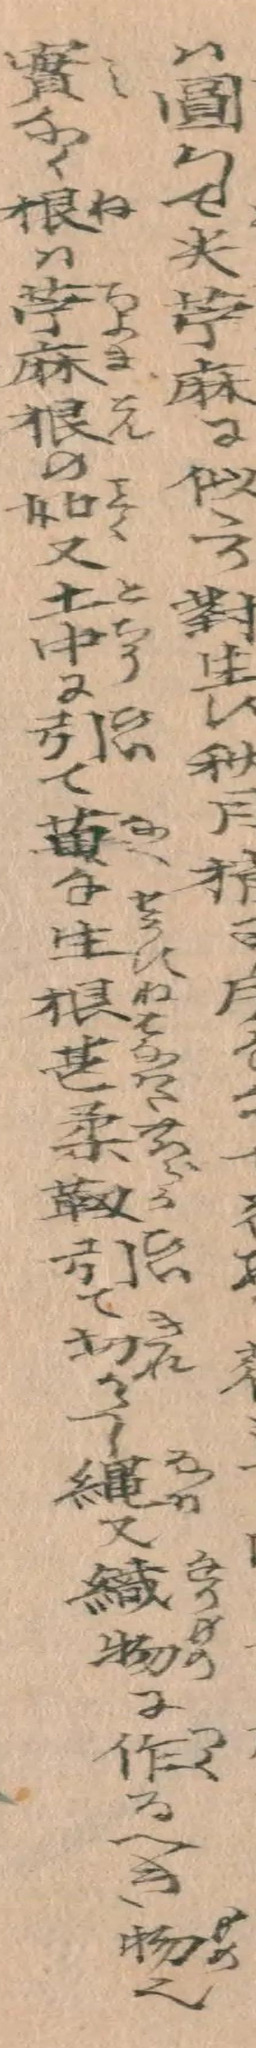実なく根は苧麻根の如又土中に引て苗を生根甚柔靱引て切かたし縄又織物に作るへき物也
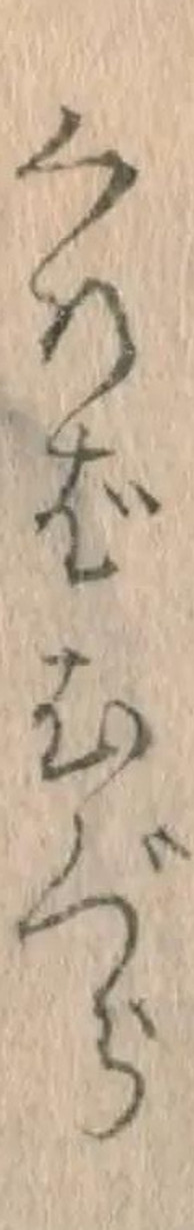くはばむぐら
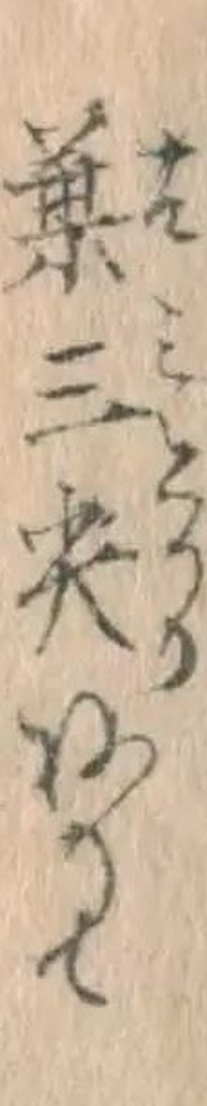葉三尖ありて
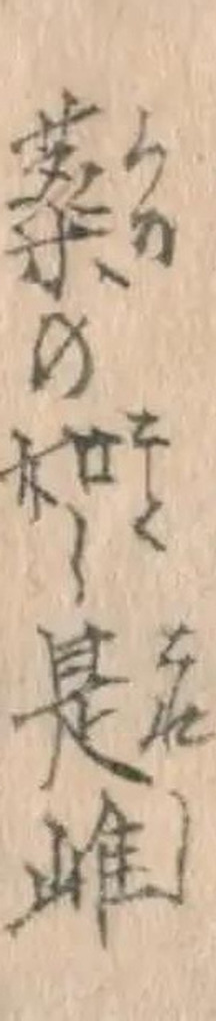𦶿の如し是雌
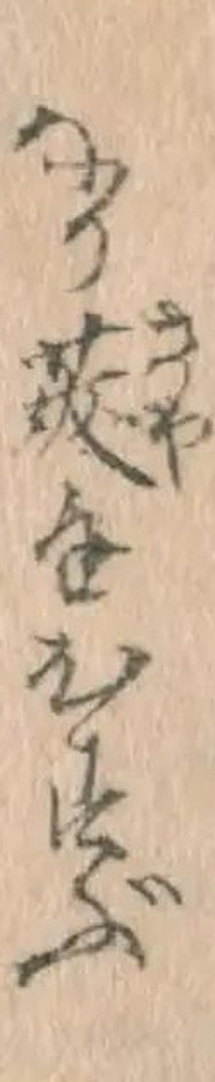なり莢をむすぶ

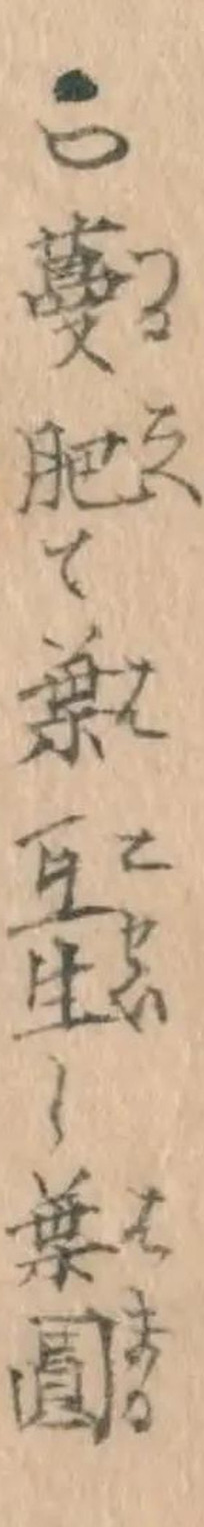●蔓肥て葉互生し葉円
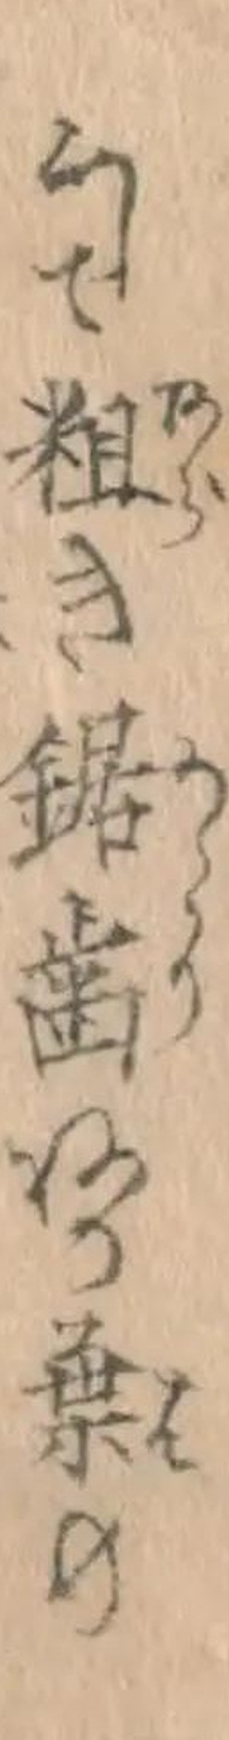くして粗き鋸歯あり葉の
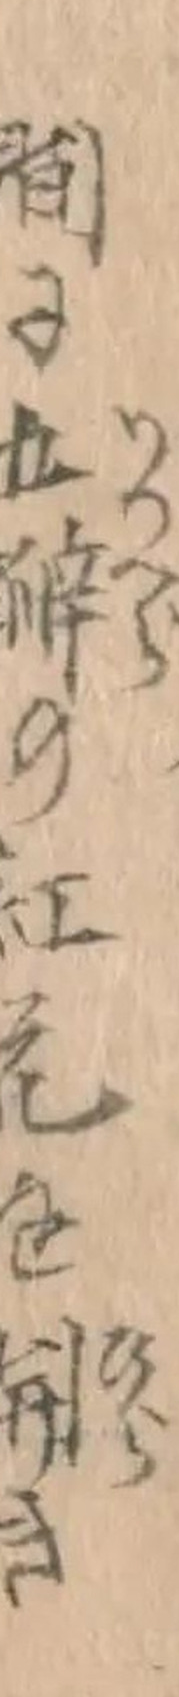間に五弁の紅花を開き
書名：本草図譜. 巻31-33
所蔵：国立国会図書館 National Diet Library, JAPAN
